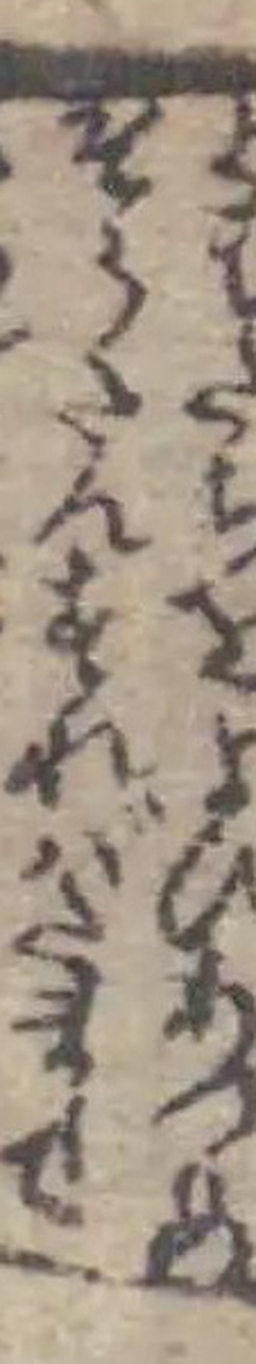そうたんすればたまして
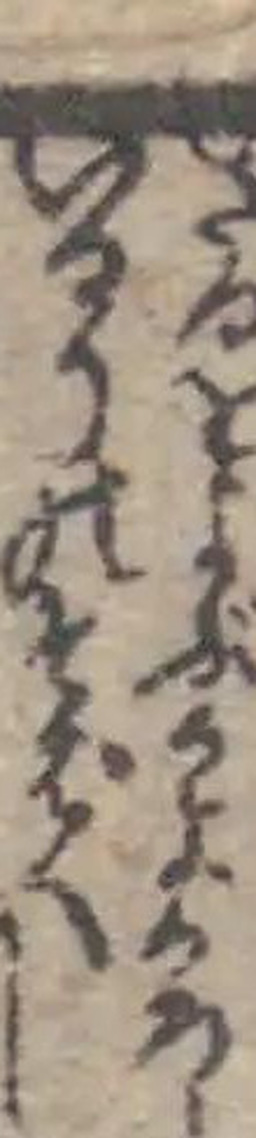いるりのそばへ
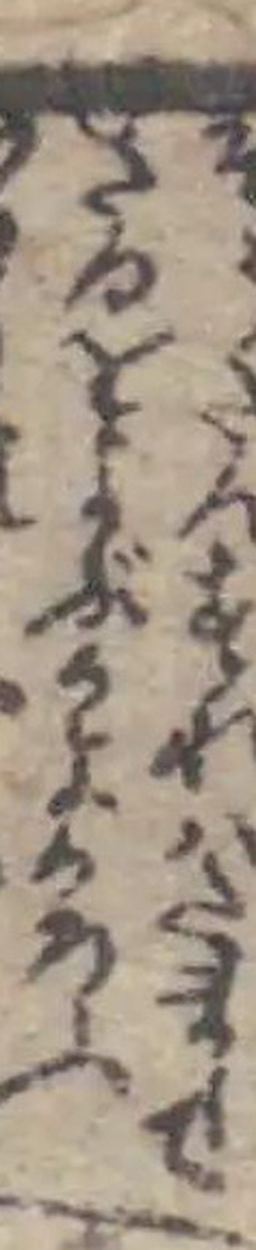さるをよぶかよかろふ
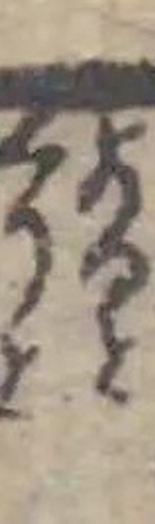くりと
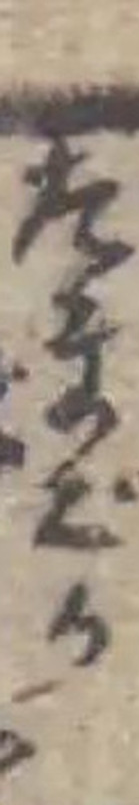たまごか
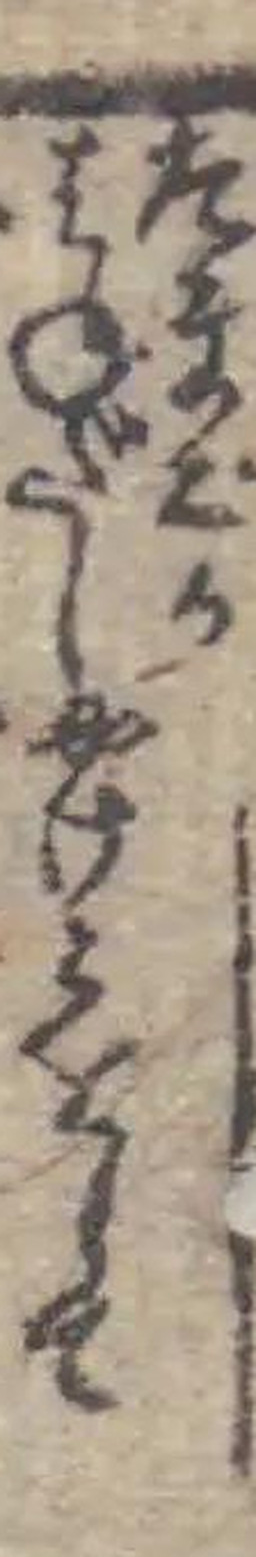はねだしやけとをして
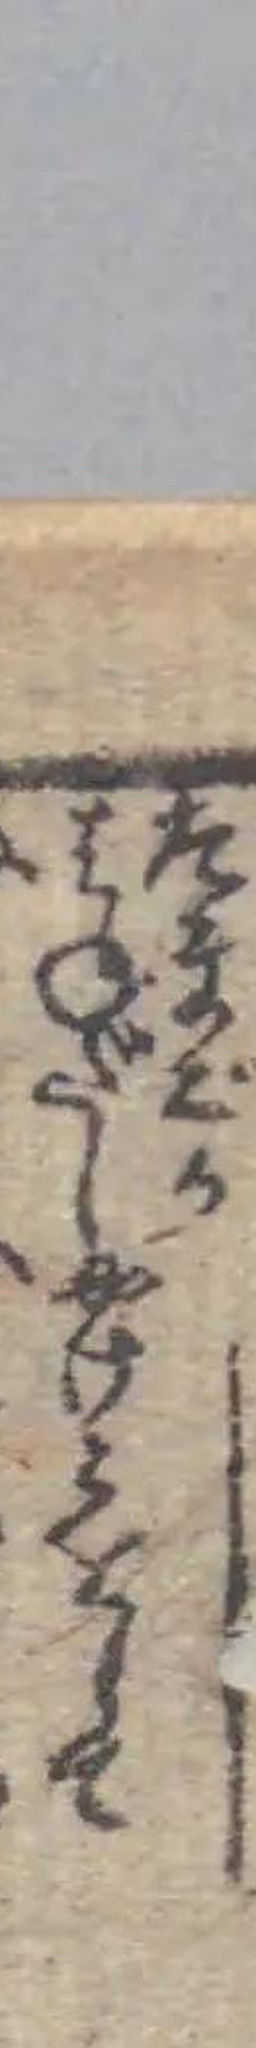はねだしやけとをして
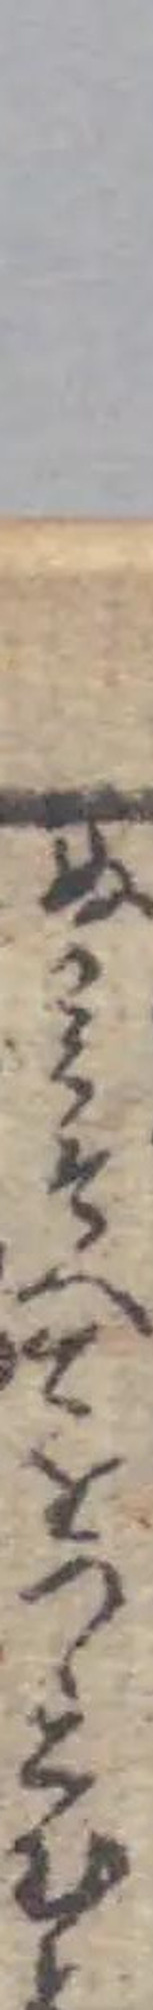ぬかみそへてをつゝこむと
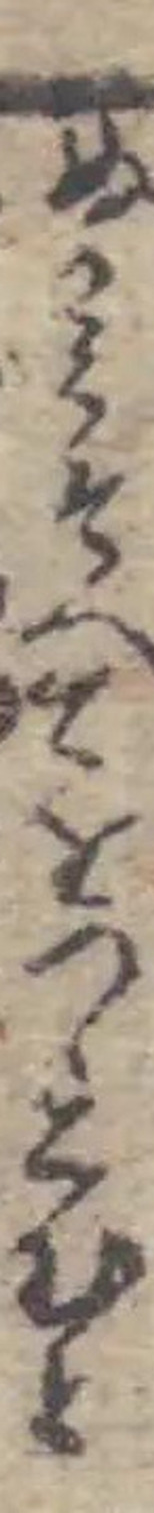ぬかみそへてをつゝこむと
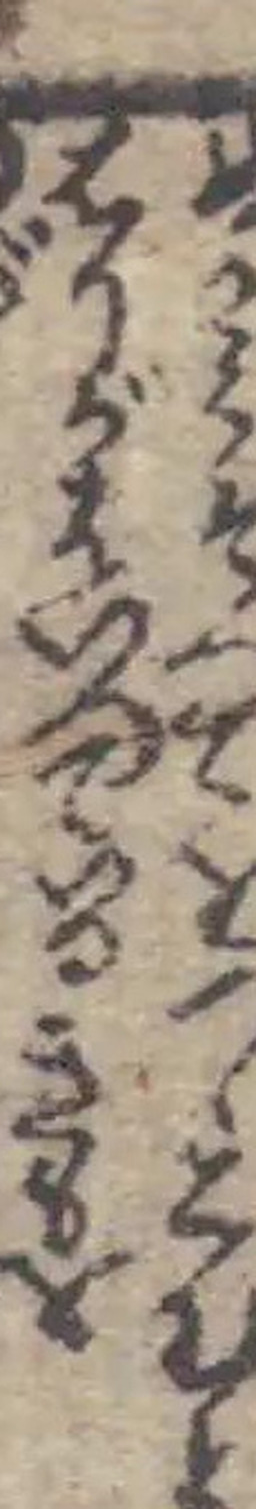はりがはいつているきもを
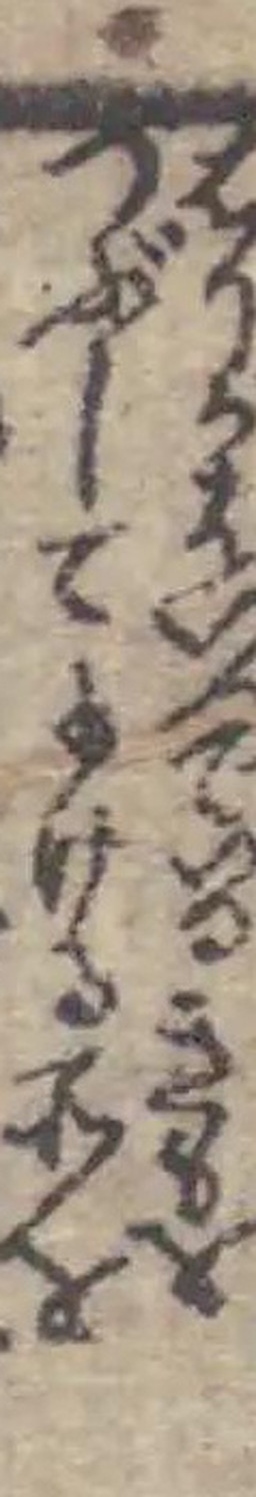つぶしてにける所を
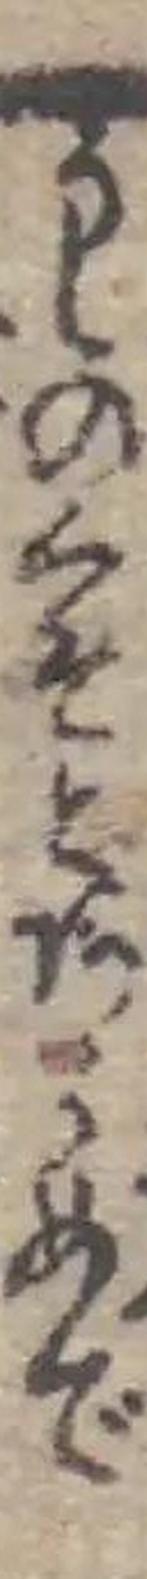うしのくそとあらめで
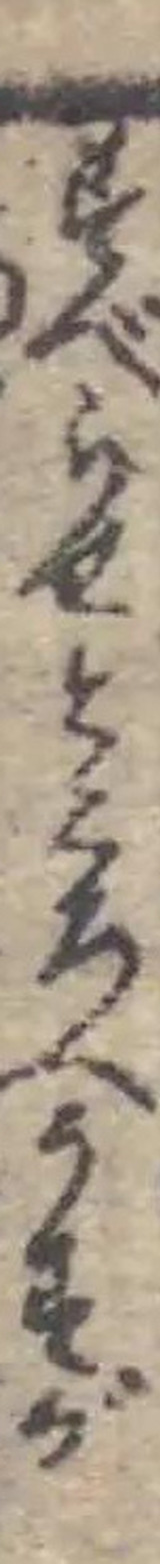すべらせところへうすが
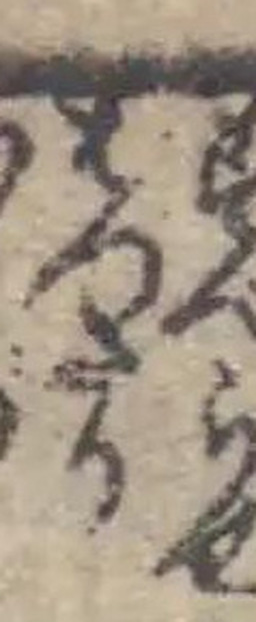はつたり
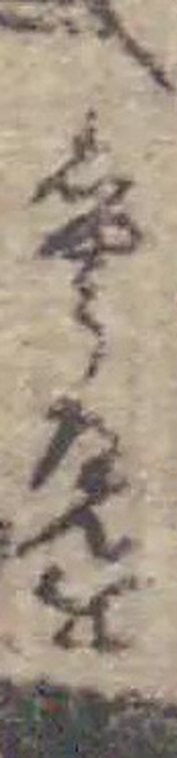しやうへんを
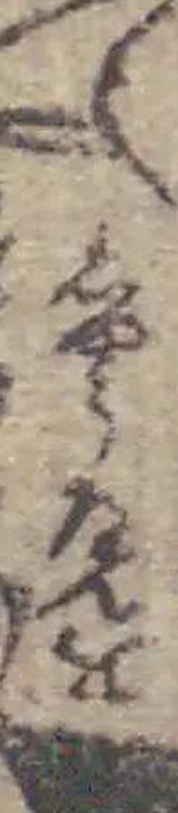しやうへんを
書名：蟹牛房挟多 3巻
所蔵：国立国会図書館 National Diet Library, JAPAN
